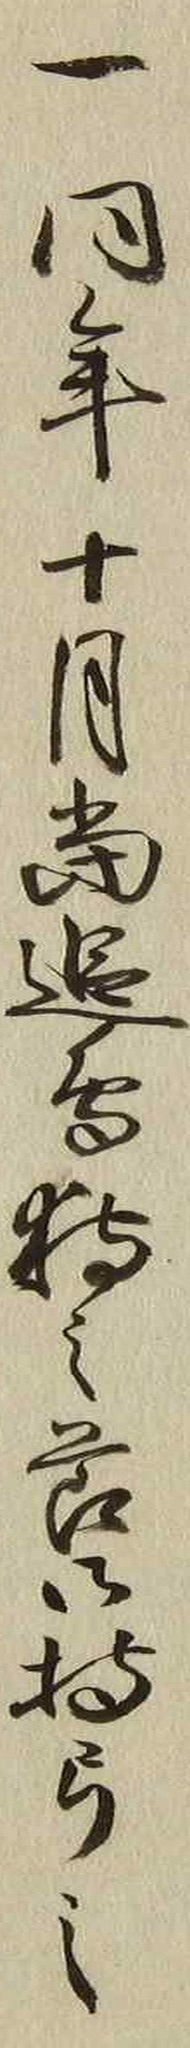一同年十月当追鳥狩之節御持弓之
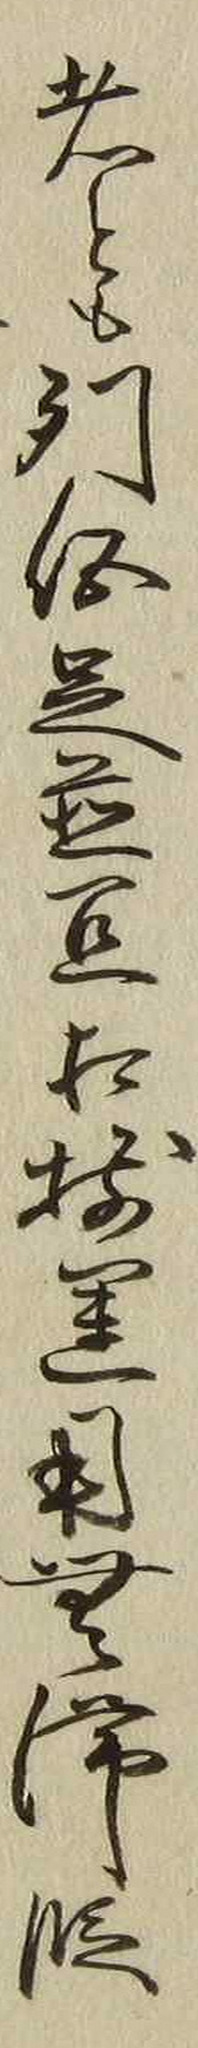者とも列伍足並宜相揃運用無滞段
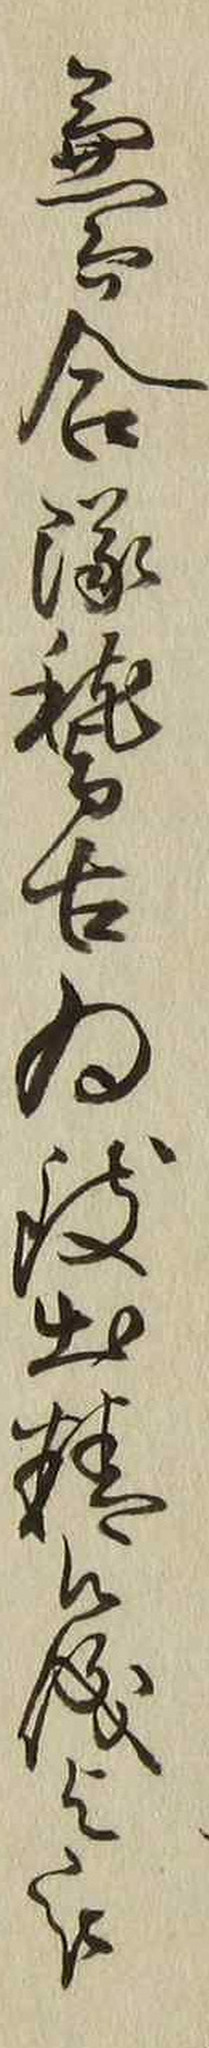兼て合隊稽古為致出精候儀与被
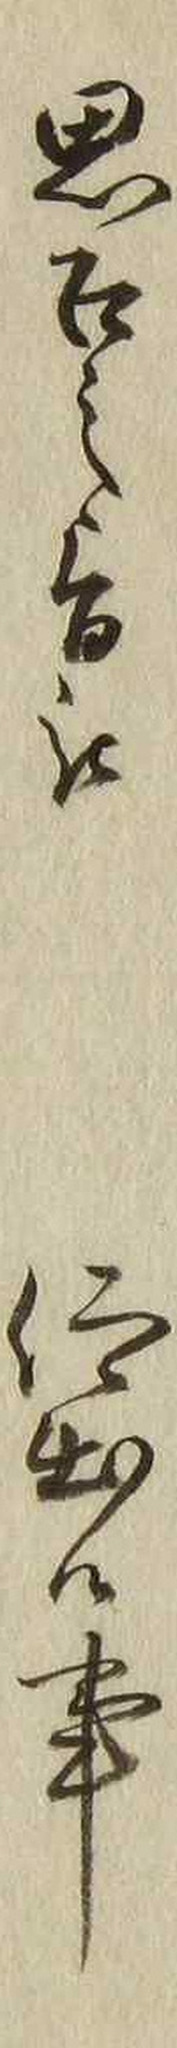思召之旨被仰出候事
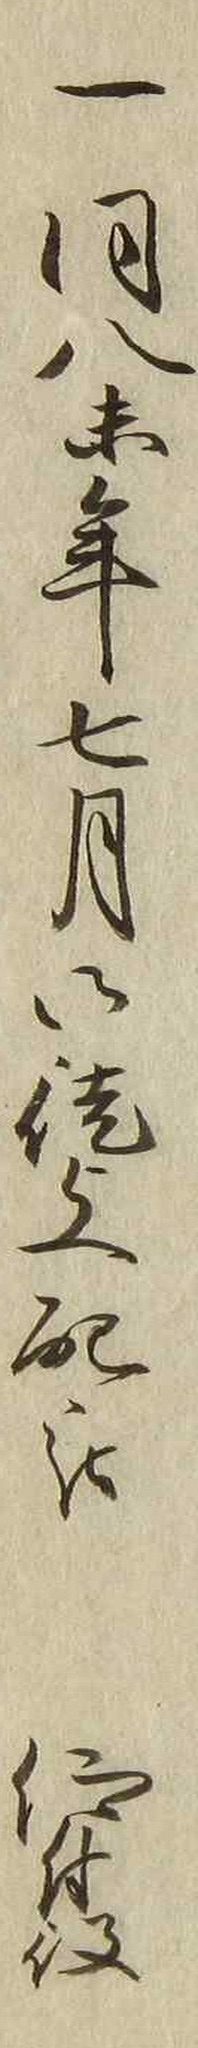一同八未年七月御徒支配被仰付役
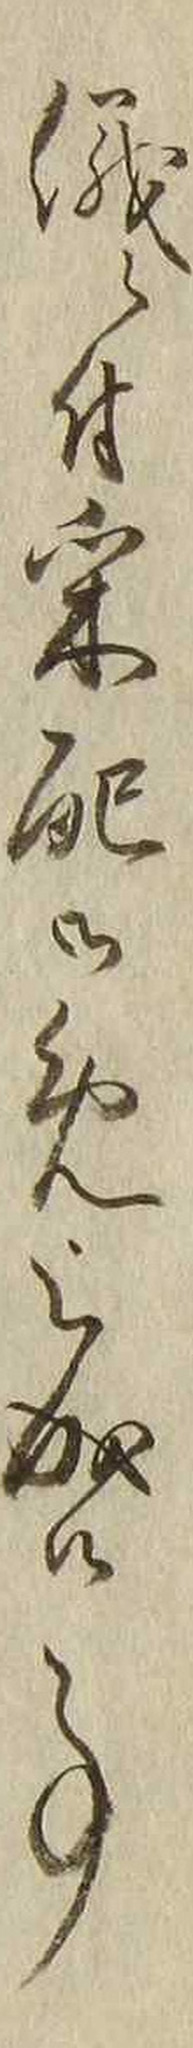儀ニ付采配御免被成候事
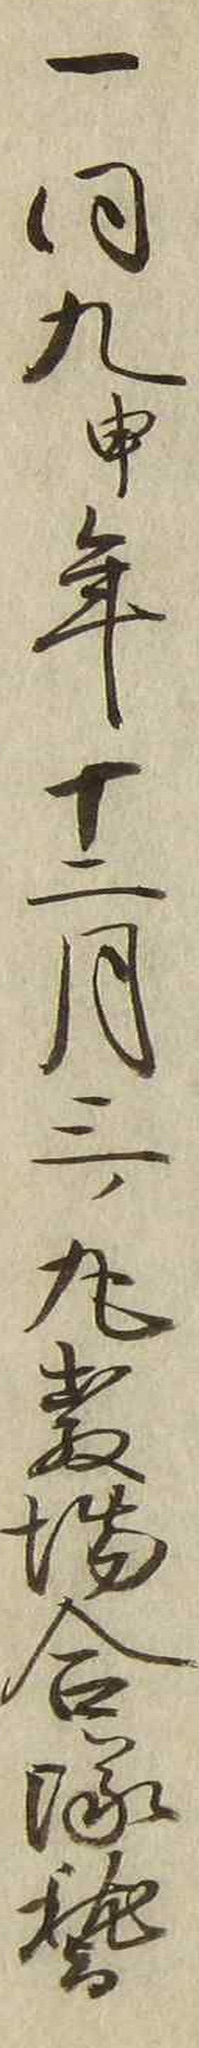一同九申年十二月三ノ丸教場合隊稽

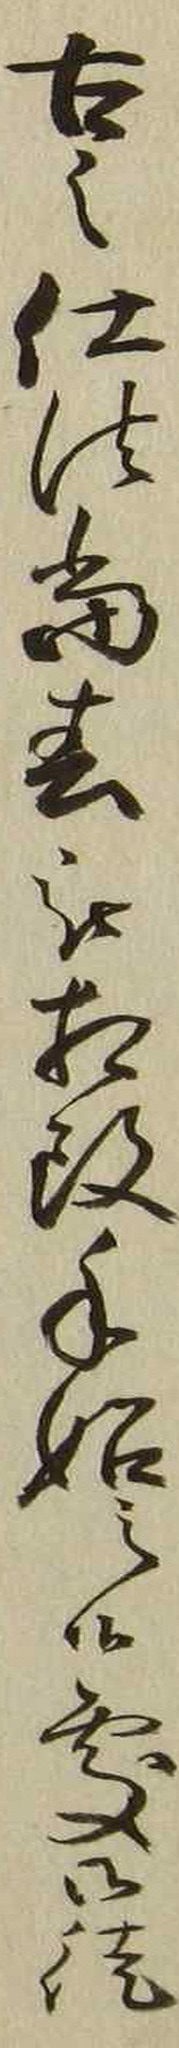古之仕法当春被相改手始之候処御徒
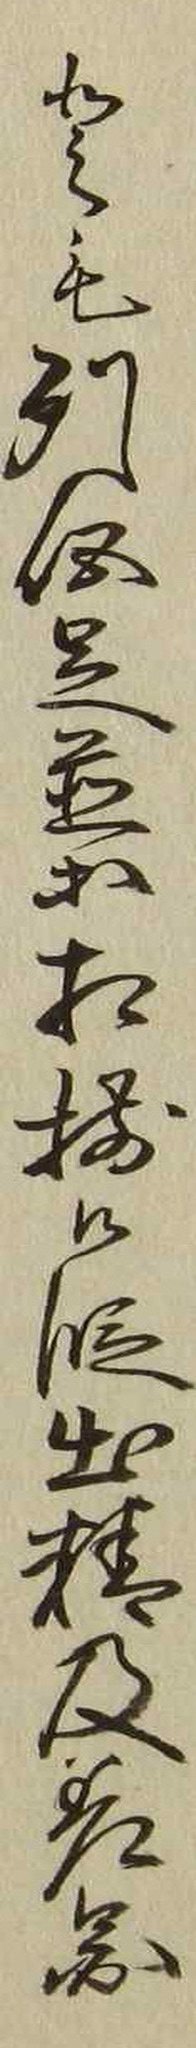とも列伍足並等相揃候段出精及差図
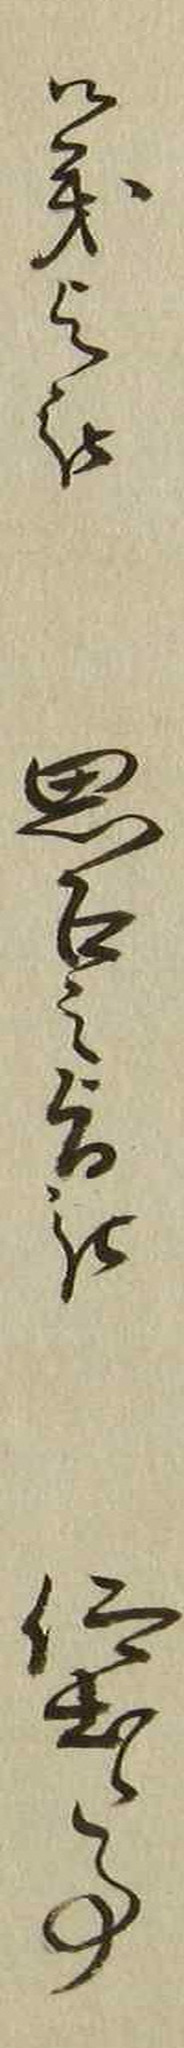候義与被思召之旨被仰出候事
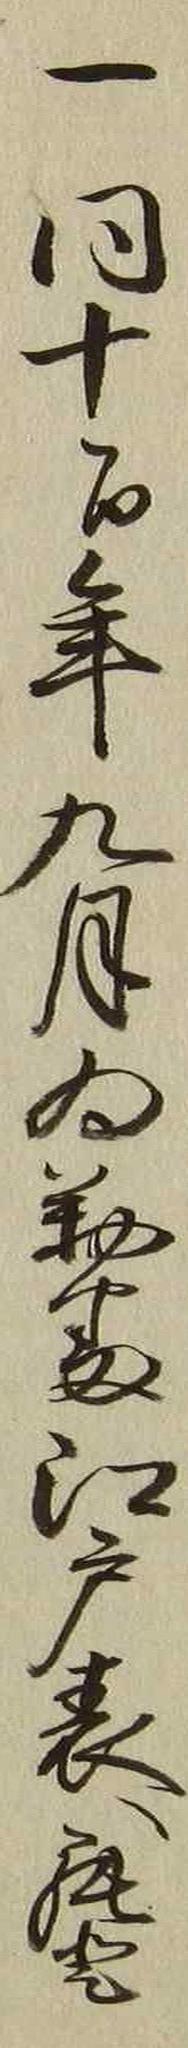一同十酉年九月為勤番江戸表へ罷登
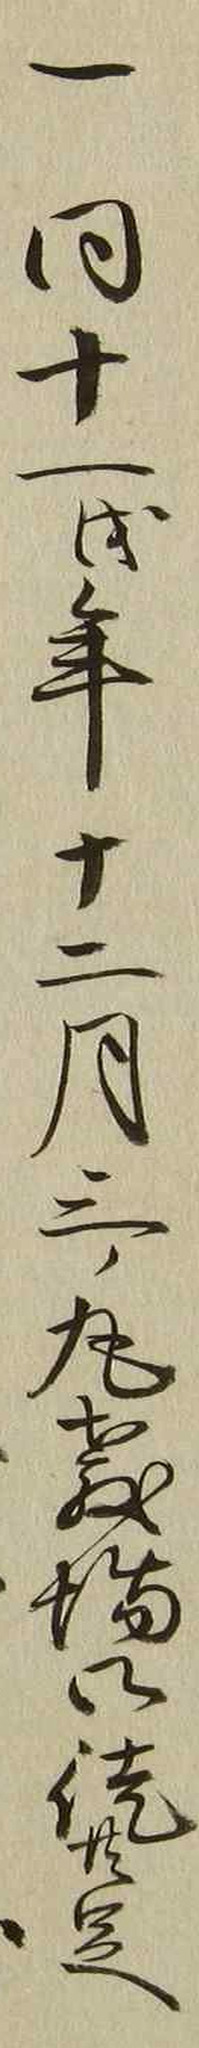一同十一戌年十二月三ノ丸教場御徒共足
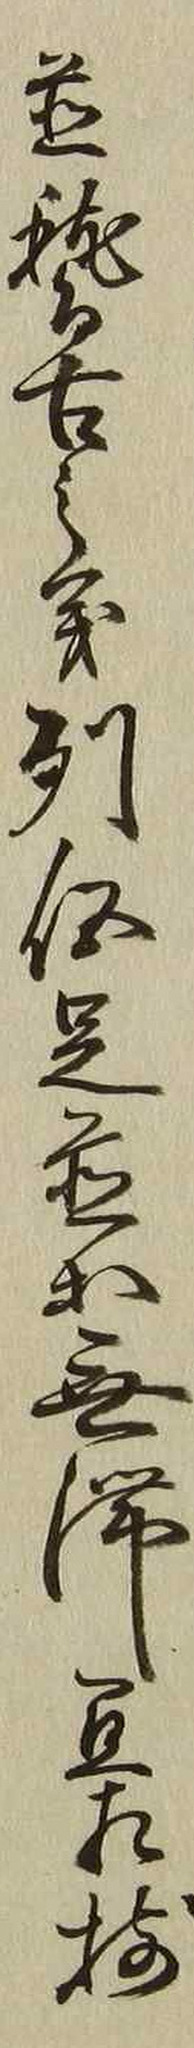並稽古之義列伍足並等無滞宜相揃
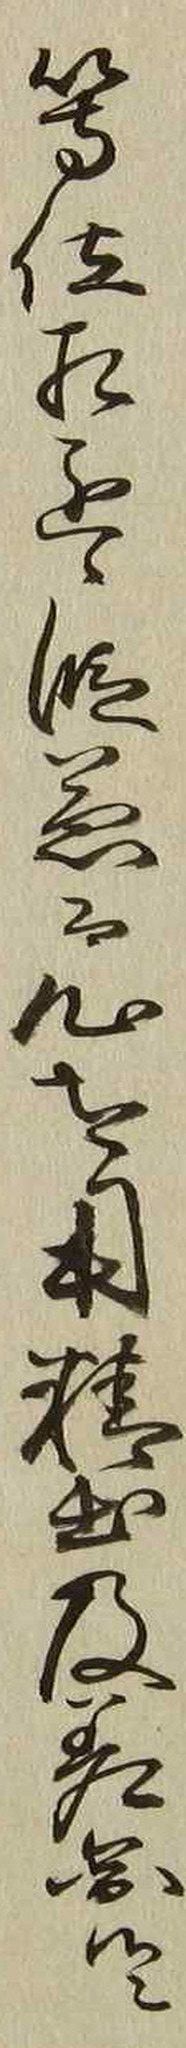等位相進候段兼而心を用精出及差図候ニ
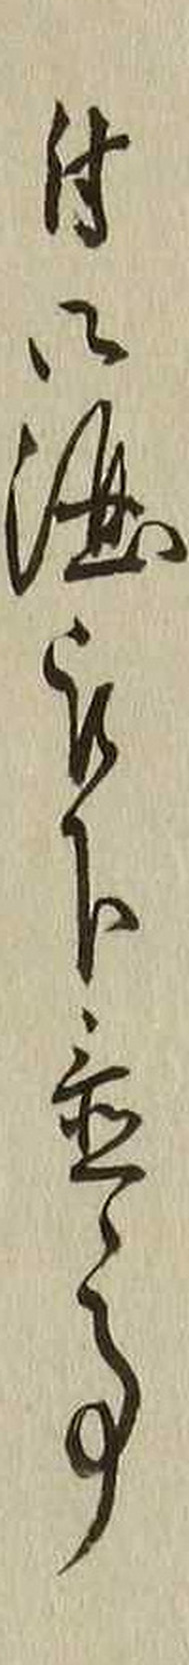付御酒被下置候事
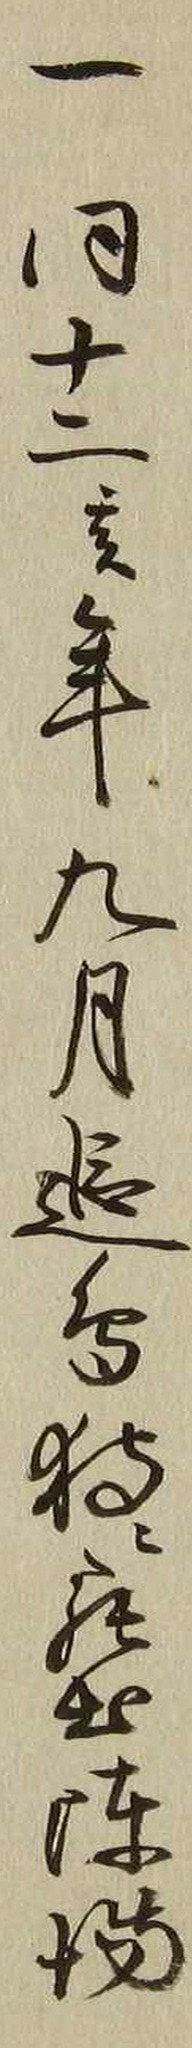一同十二亥年九月追鳥狩ニ罷出陣場
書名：諸士系譜　巻之60　と之部3
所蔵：会津若松市立会津図書館
